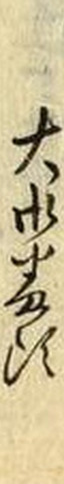名大御番頭
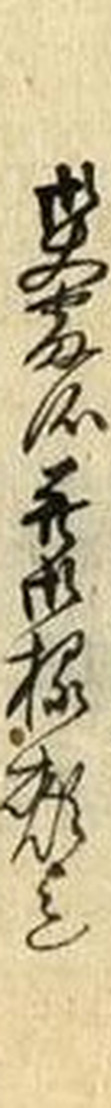御使番所并御椽頬迄
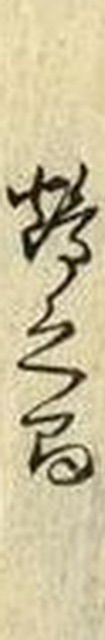鶴之間
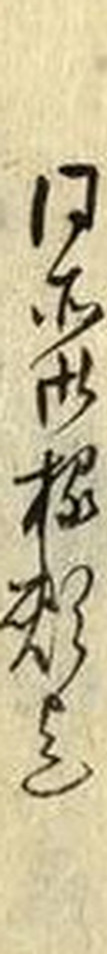同所御椽頬迄
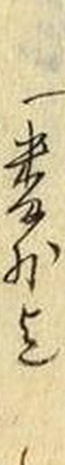番外迄
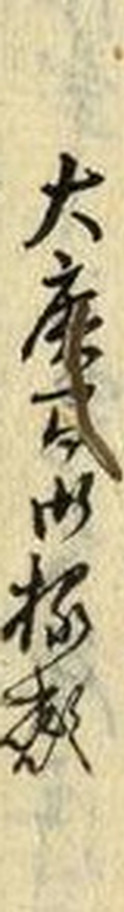大広間御椽頬
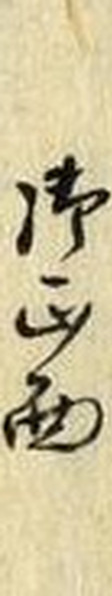御正面
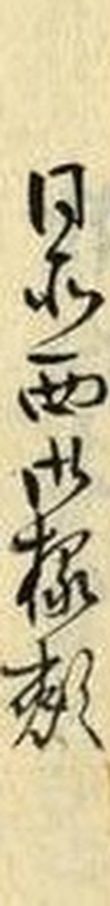同所西御椽頬
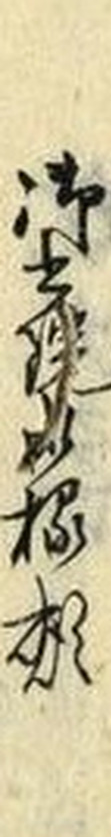御書院御椽頬
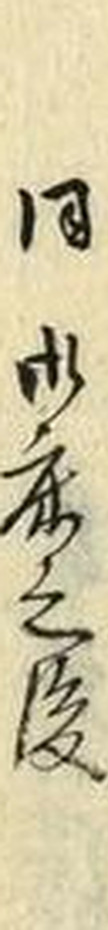同御床之後
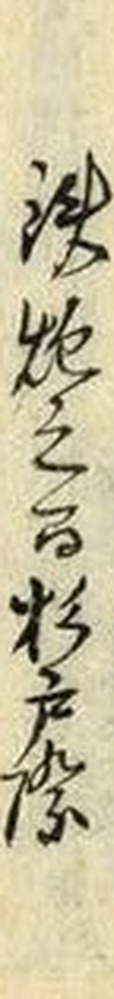鉄炮之間杉戸際
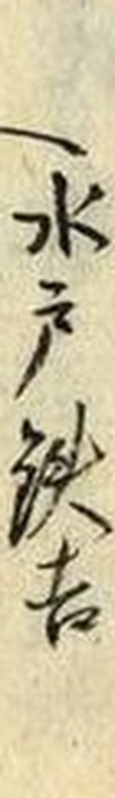水戸鉄吉
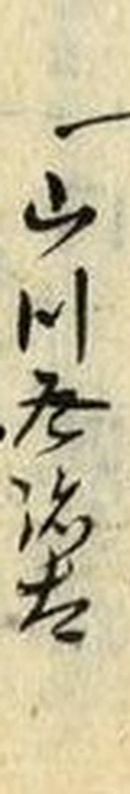山川登弥太
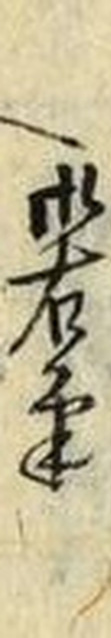御右筆
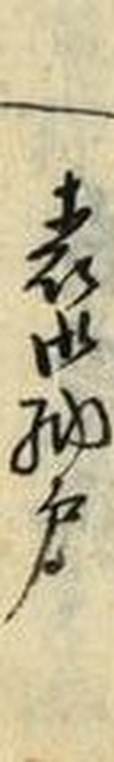表御納戸

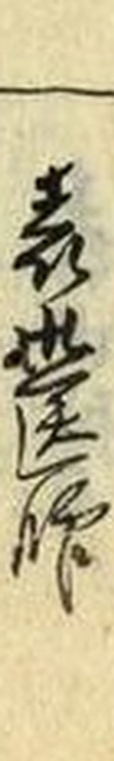表御医師
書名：少傅日録抄（斉善付側向頭取日記、江戸并道中、初入在国、逝去後…
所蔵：福井県文書館 Fukui Prefectural Archives
